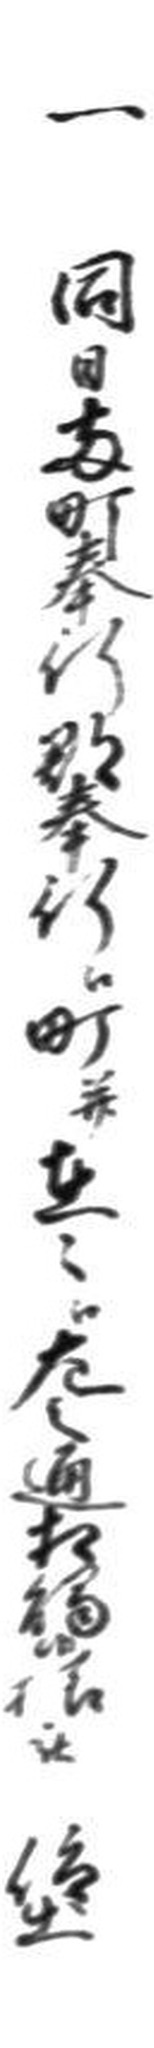一同日両町奉行郡奉行江町并在々江左之通相触候様被仰出
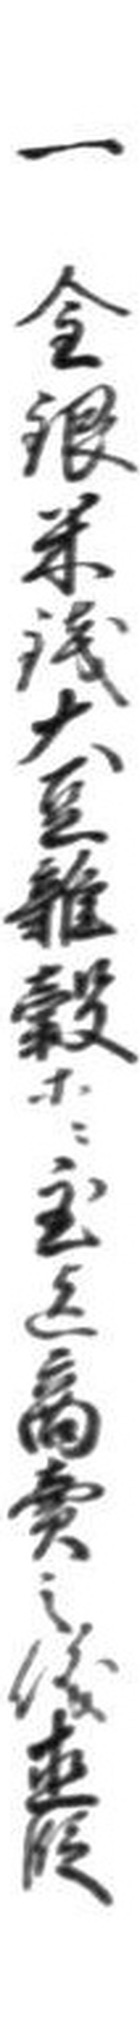一金銀米銭大豆雑穀等ニ至迄商売之儀値段

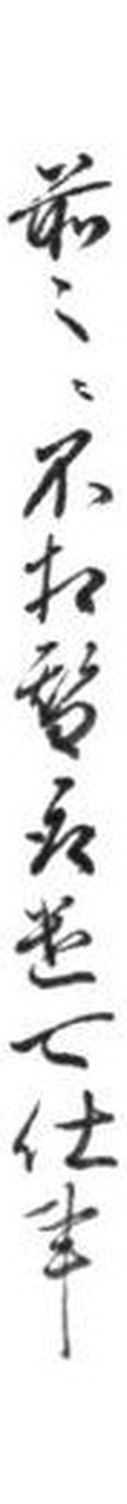前々ニ不相替取遣可仕事
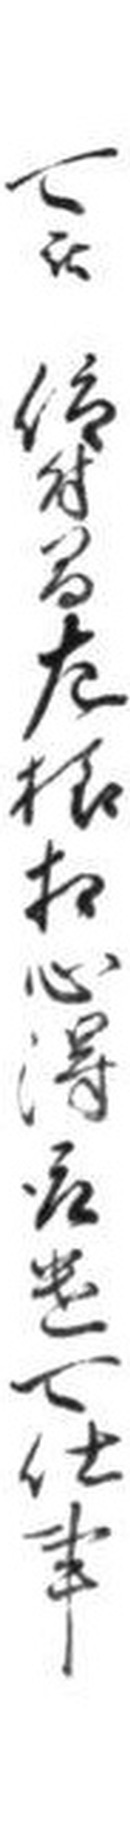可被仰付け間左様相心得取遣可
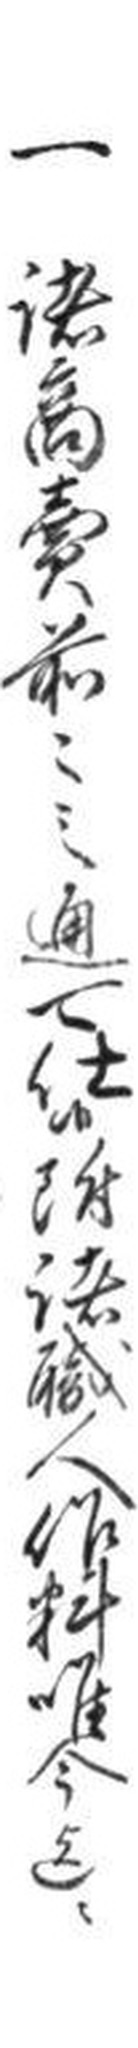一諸商売前々之通可仕候附諸職人作料唯今迄ニ
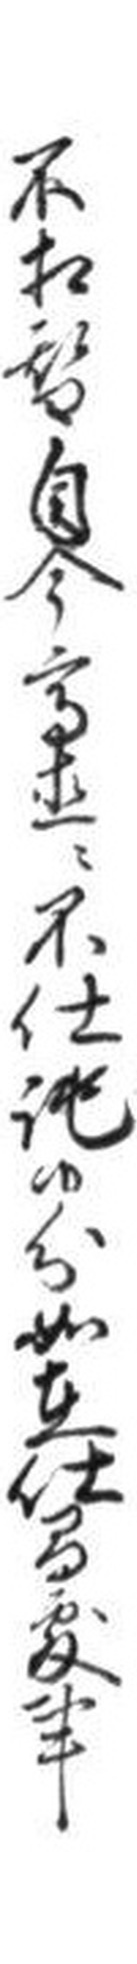不相替自今高直不仕訳候分如在仕間敷事
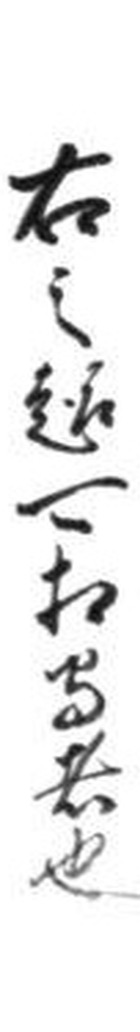右之趣可相聞者也
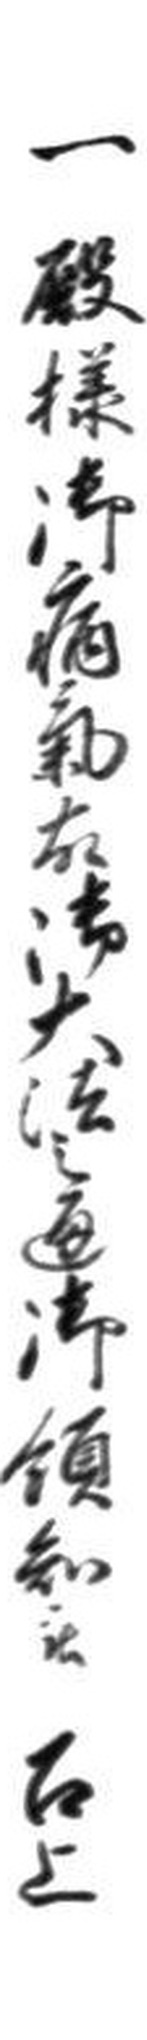一殿様御病気故御大法之通御領知被召上
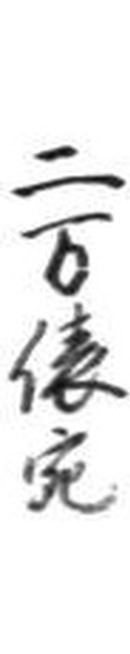二万俵宛
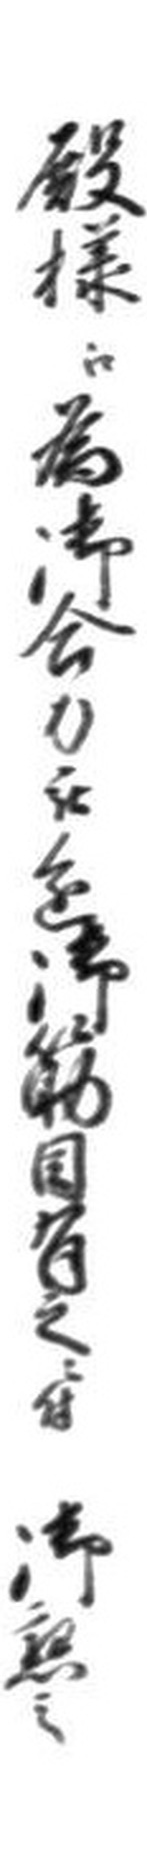殿様江為御合力被進御筋目有之ニ付御憐之
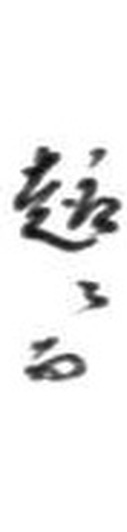趣ニ而
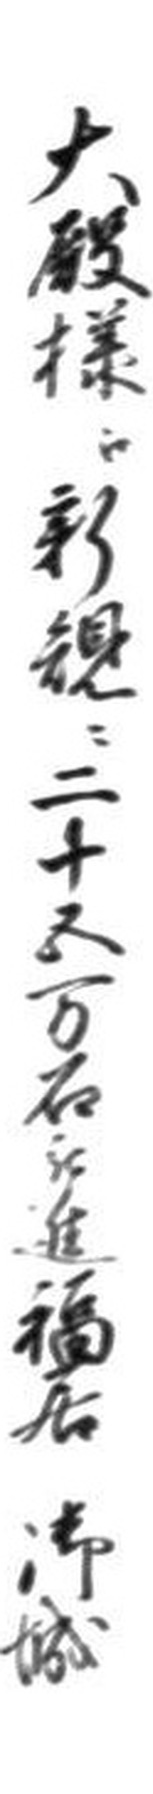大殿様江新視ニ二十五万石被進福居御城
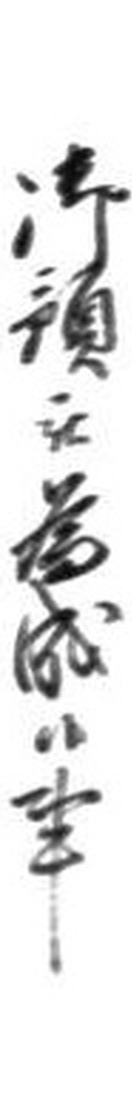御領被為成候事
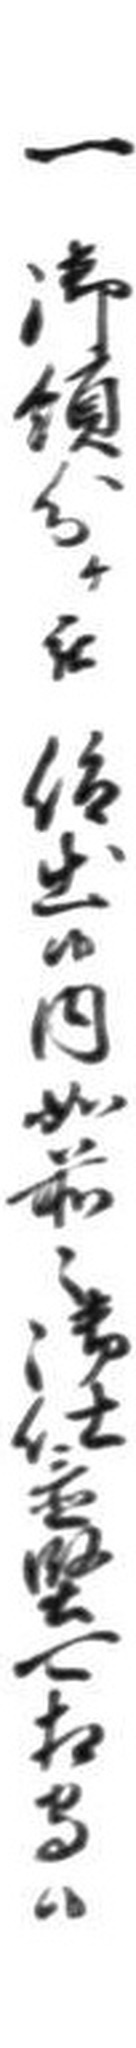一御領分ケ被仰出候内如前之御仕置堅可相聞候
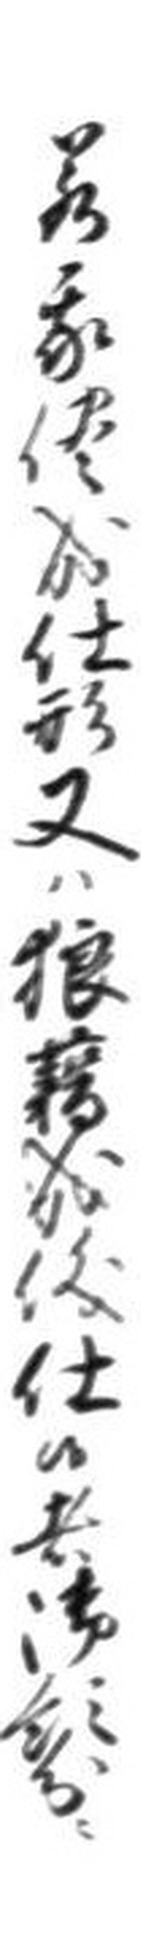若我侭成仕形又ハ狼藉成儀仕候者御領分ニ

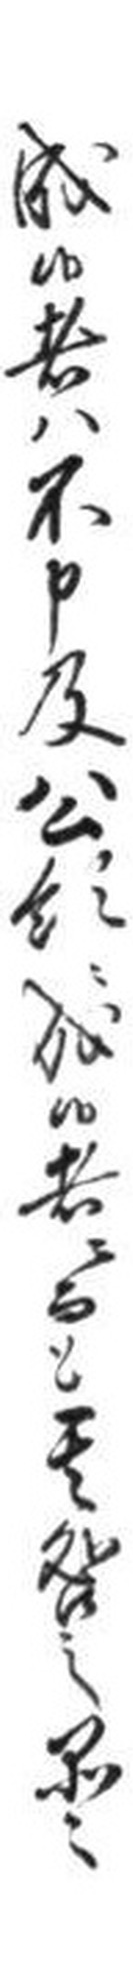成候者ハ不申及公領ニ成候者ニ而も其咎之品々
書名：家譜 十六 吉品公 従貞享三年閏三月到同四年
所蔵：福井県文書館 Fukui Prefectural Archives
